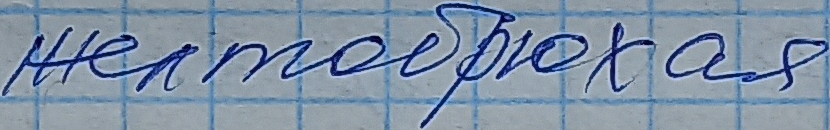желтобрюхая
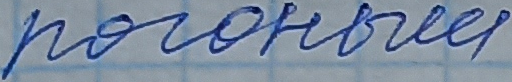погоныш
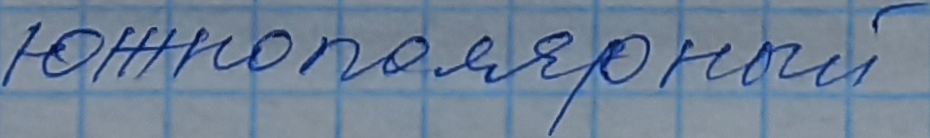южнополярный
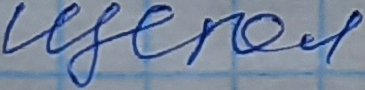щегол
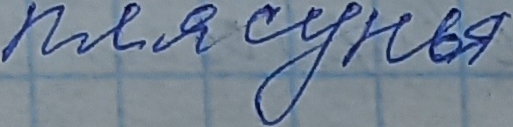плясунья
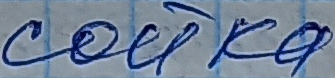сойка
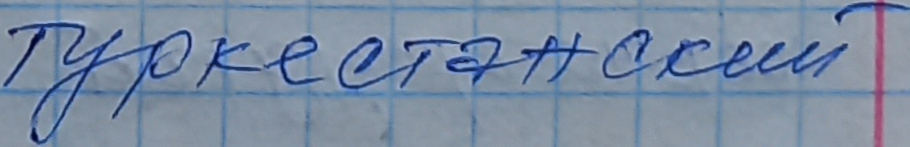туркестанский
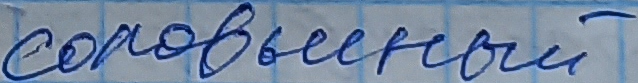соловьиный
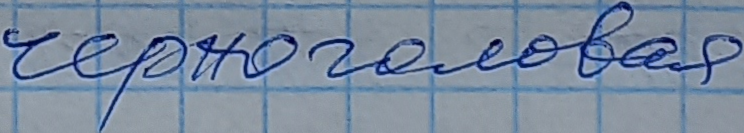черноголовая
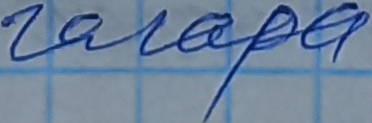гагара
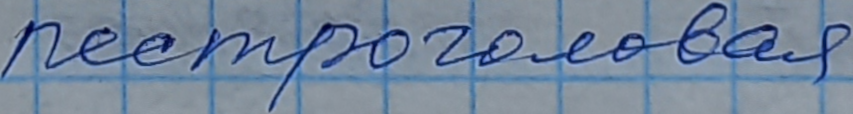пестроголовая
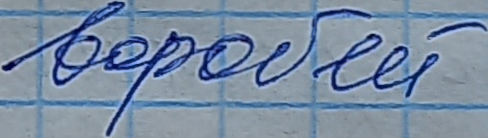воробей
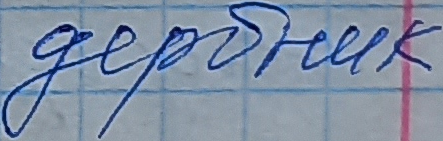дербник
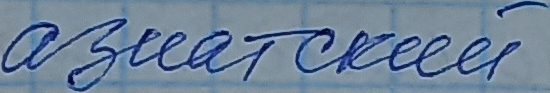азиатский
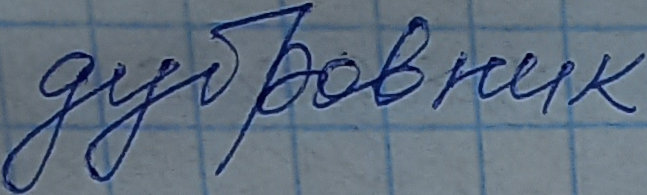дубровник
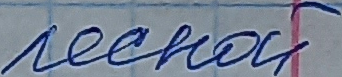лесной
